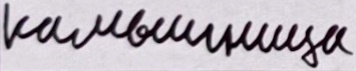камышница
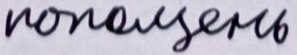поползень
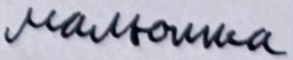малютка
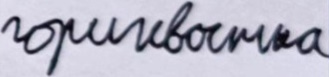горихвостка
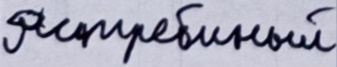ястребиный
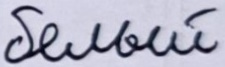белый
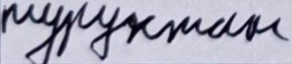турухтан
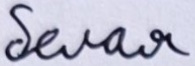белая
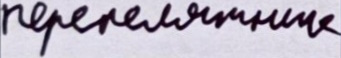перепелятник
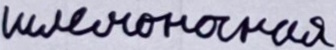шлемоносная
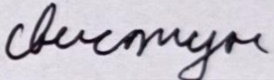свистун
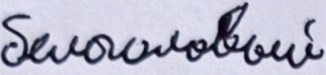белоголовый
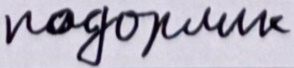подорлик
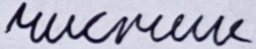чистик
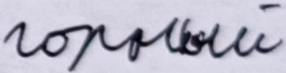горный
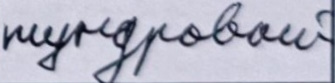тундровый
